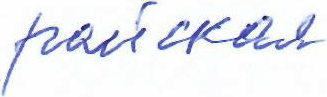райская
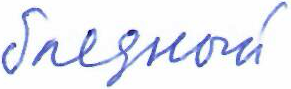бледный
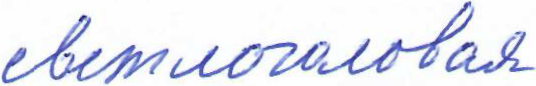светлоголовая
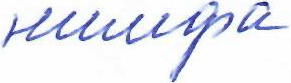нимфа
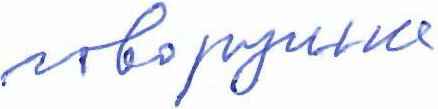говорушка
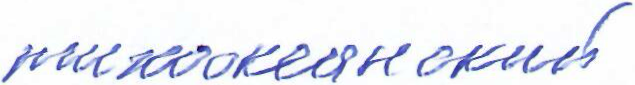тихоокеанский
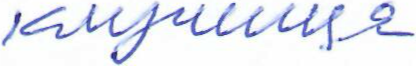клушица
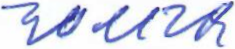чомга
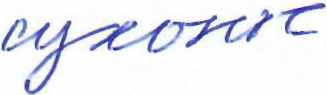сухонос
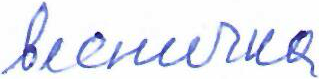весничка
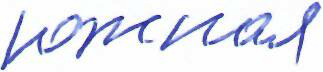южная
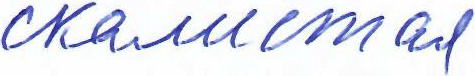скалистая
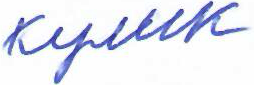кулик
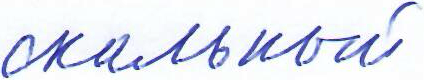скальный
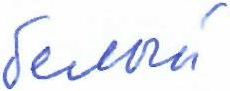белый
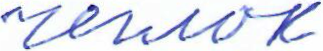чеглок
